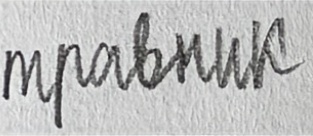травник
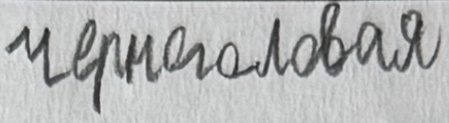черноголовая
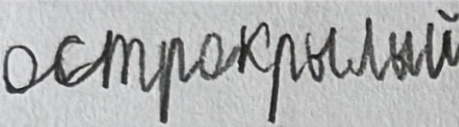острокрылый
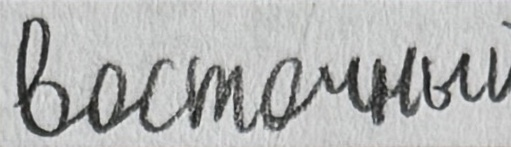восточный
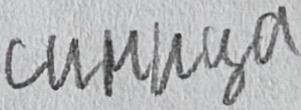синица
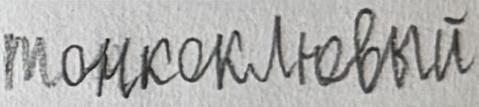тонкоклювый
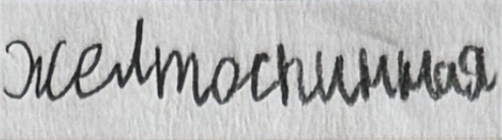желтоспинная
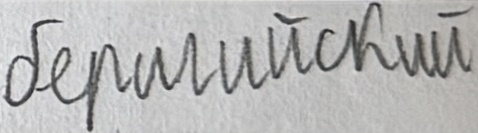беригийский
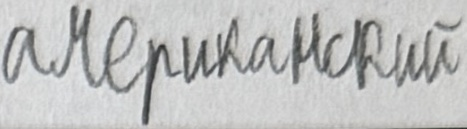американский
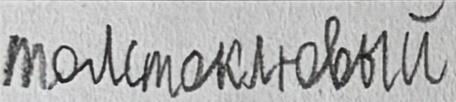толстоклювый
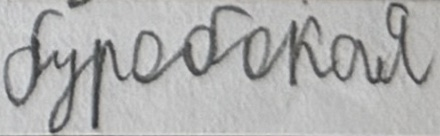буробокая
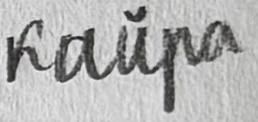кайра
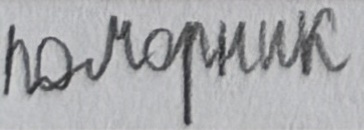поморник
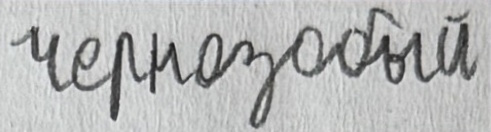чернозобый
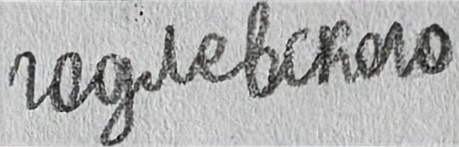годлевского
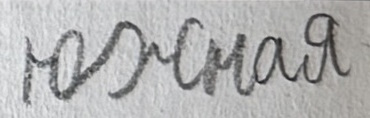южная
